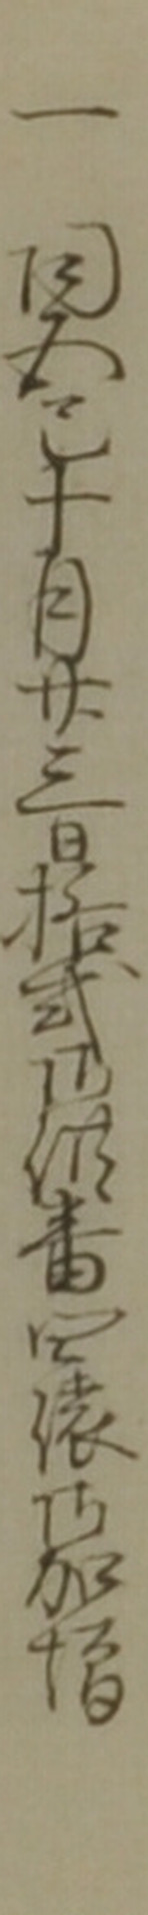一同五巳十月廿三日格式御供番四俵御加増
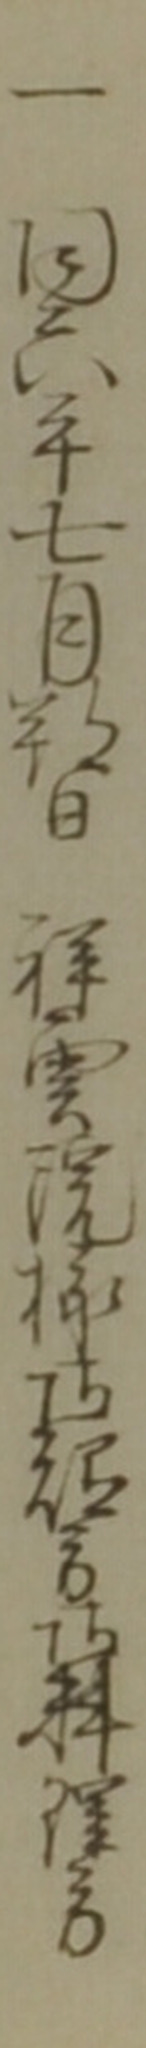一同六午七月朔日祥雲院様御賄方御料理方
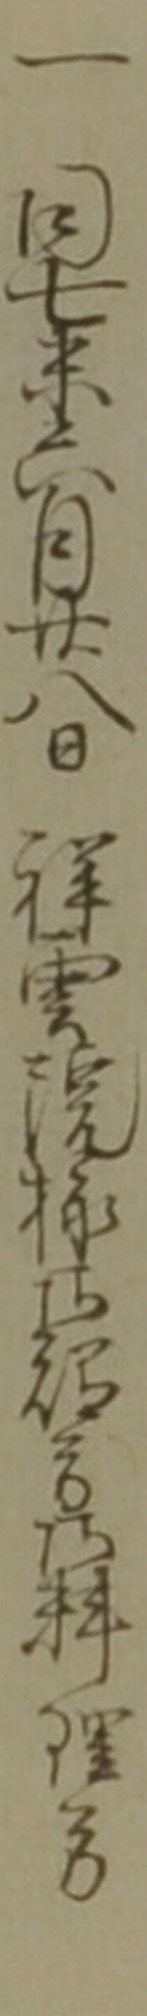一同七未六月廿八日祥雲院様御賄方御料理方
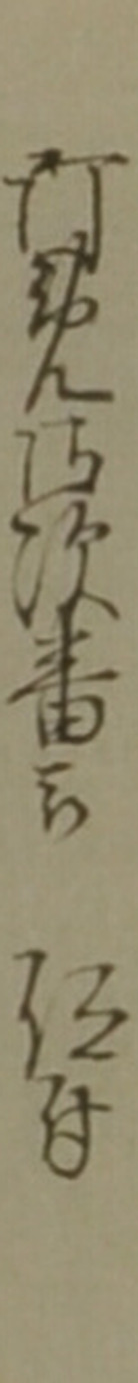御免御次番被仰付
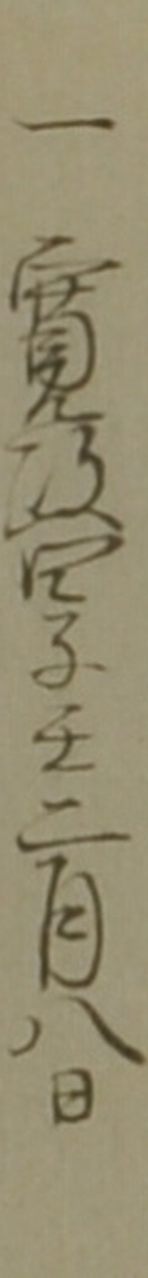一寛政四子閏二月八日
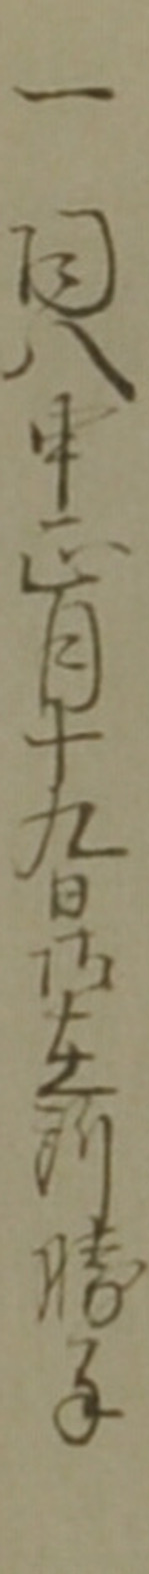一同八申正月十九日御在所勝手
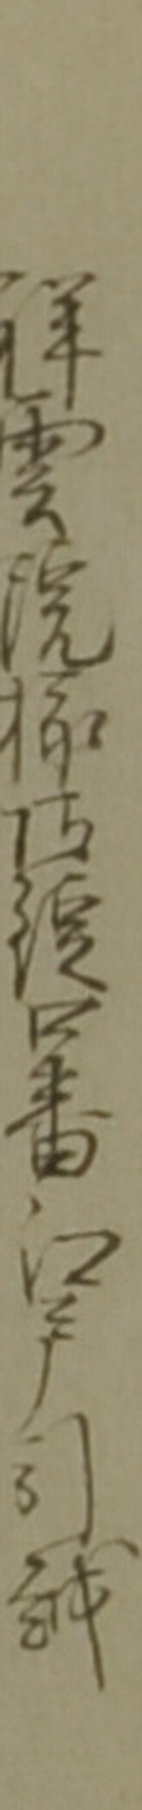祥雲院様御錠口番江戸引越
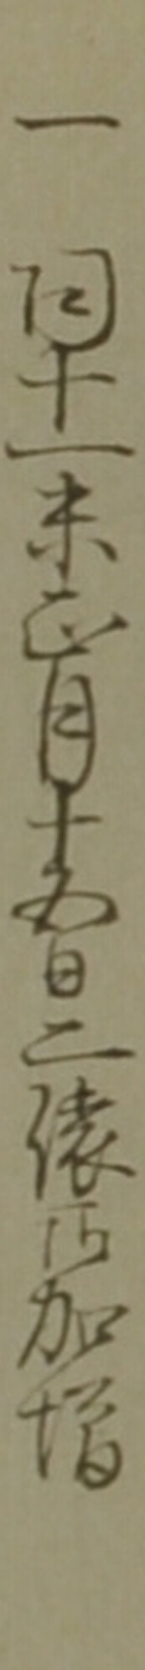一同十一未正月十五日二俵御加増
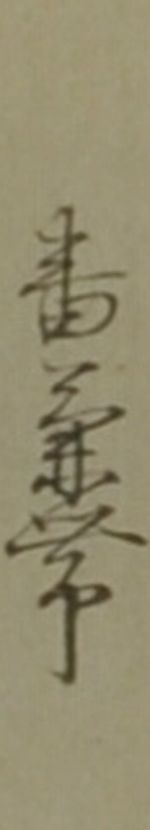番兼帯
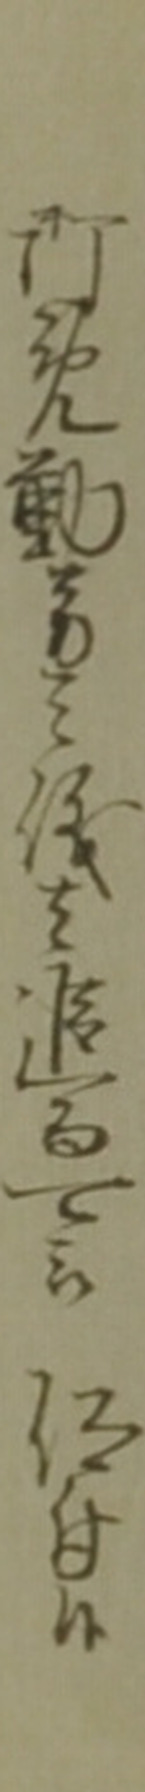御免勤方之儀者追而可被仰付候
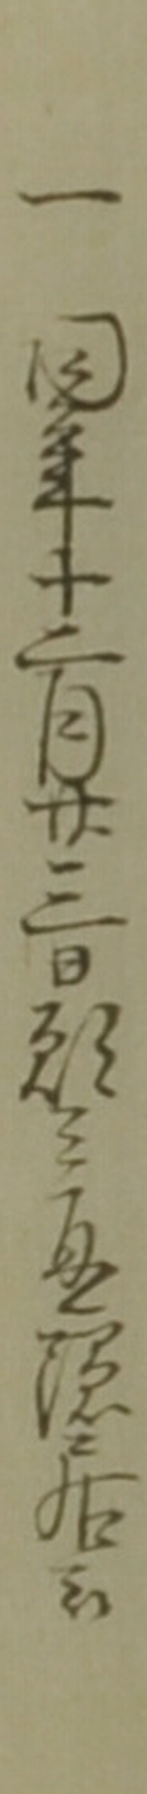一同年十二月廿三日願之通隠居被
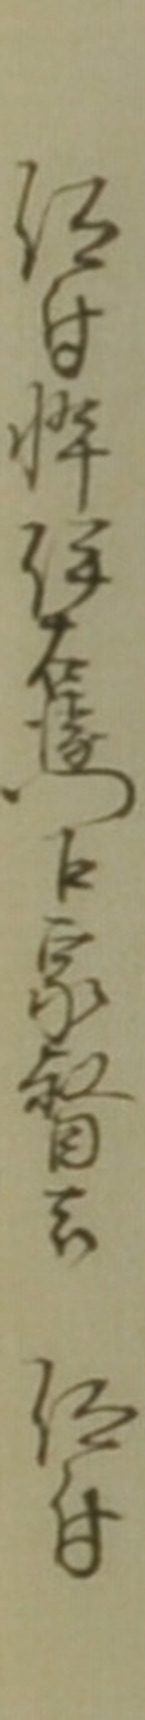仰付忰伊右衛門江家督被仰付

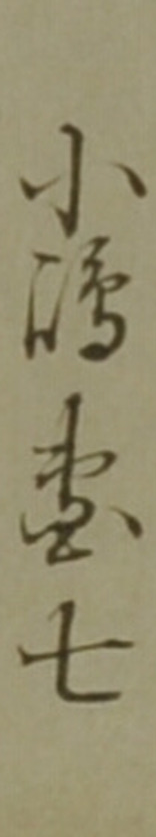小嶋團七
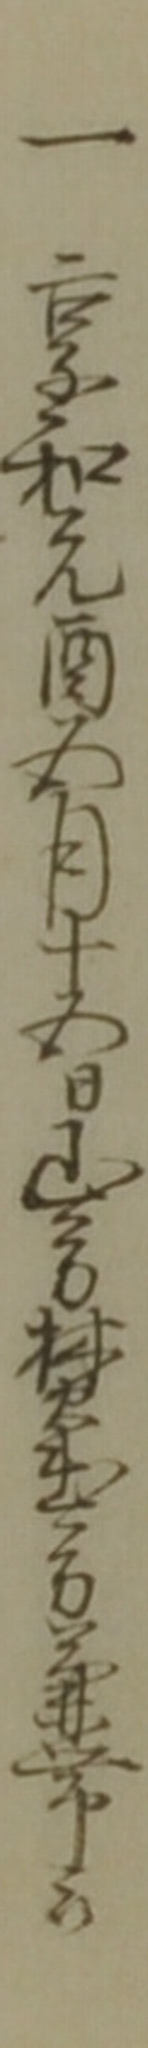一享和元酉五月十五日山方焚出方兼帯被
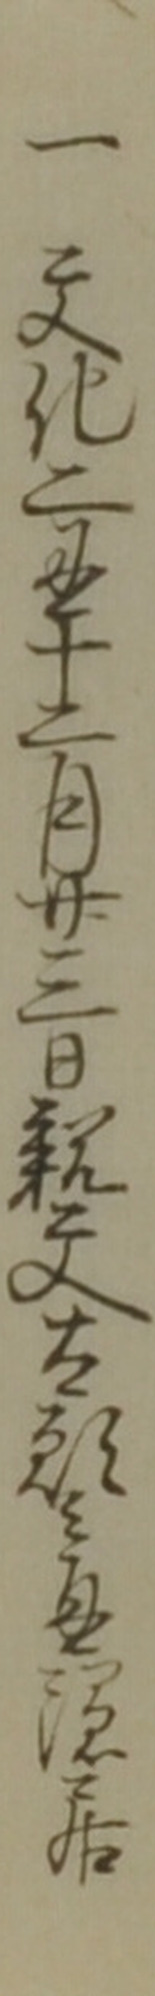一文化二丑十二月廿三日親文太願之通隠居
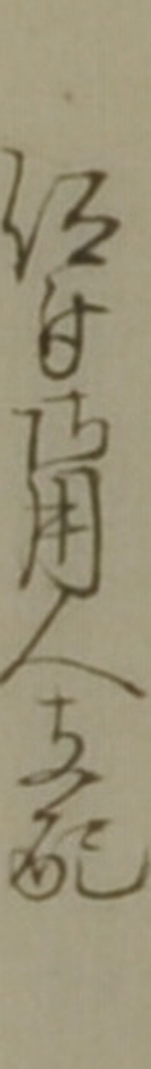仰付御用人支配
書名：無足諸士勤仕録（五）
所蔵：伊那市立高遠町図書館・合同会社AMANE
